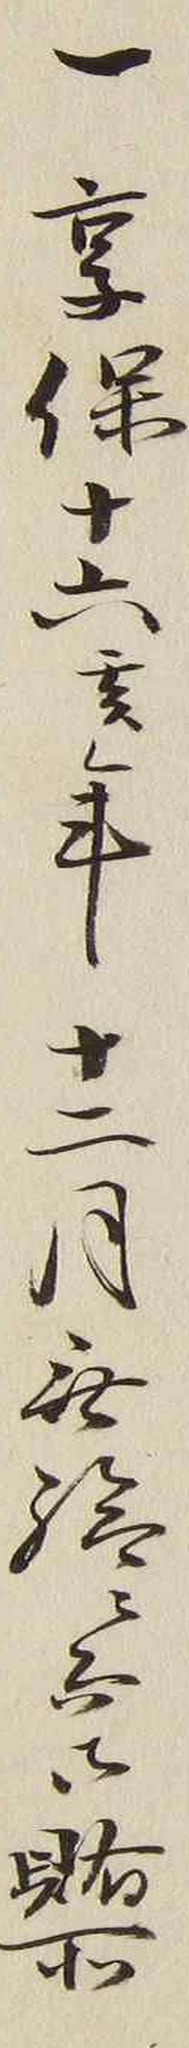一享保十六亥年十二月無給ニ而御賄所

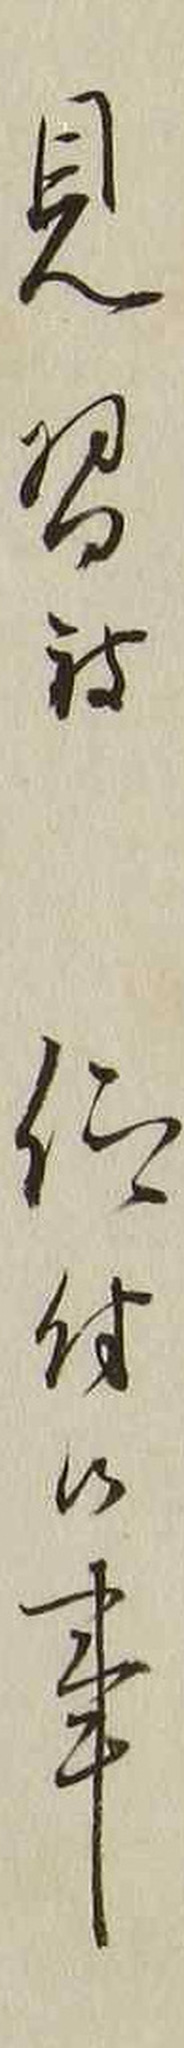見習被仰付候事
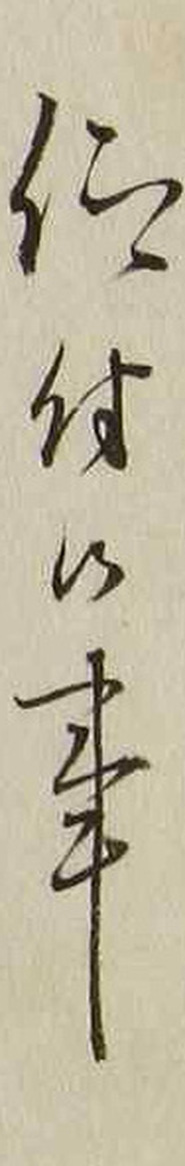仰付候事
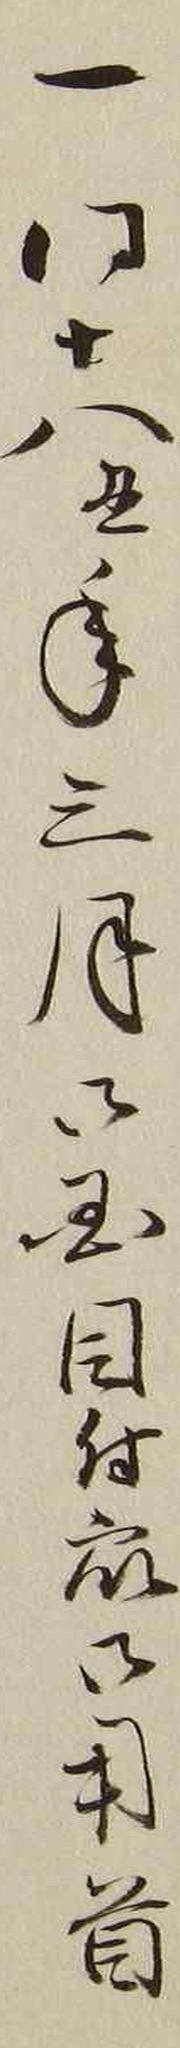一同十八丑年三月御国目付衆御用首
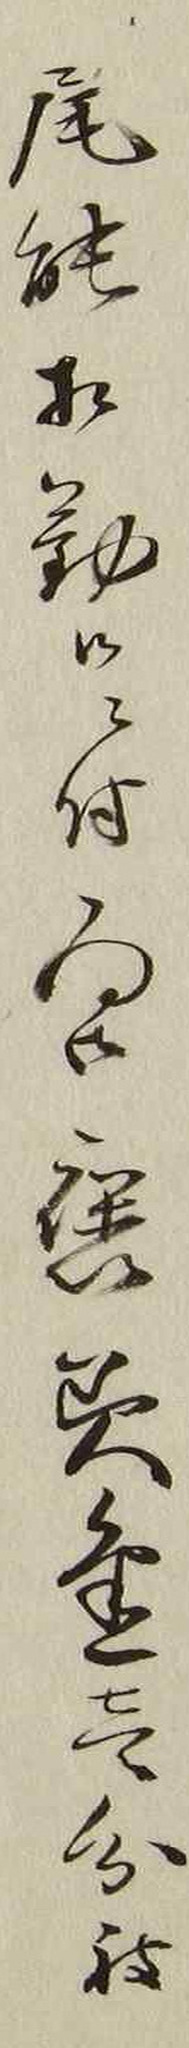尾能相勤候ニ付為御褒美金壱分被
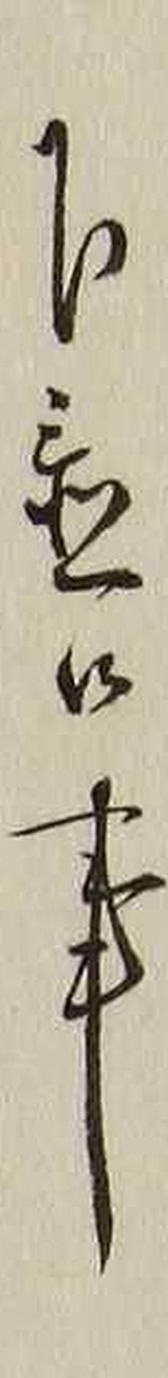下置候事
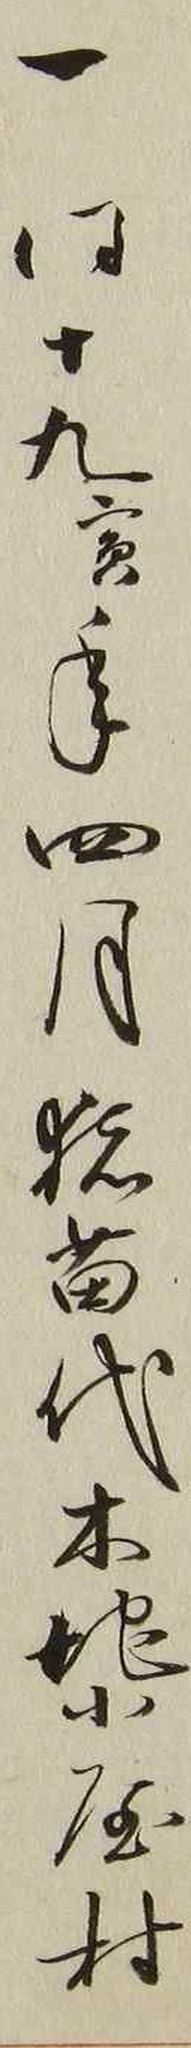一同十九寅年四月猪苗代木地小屋村
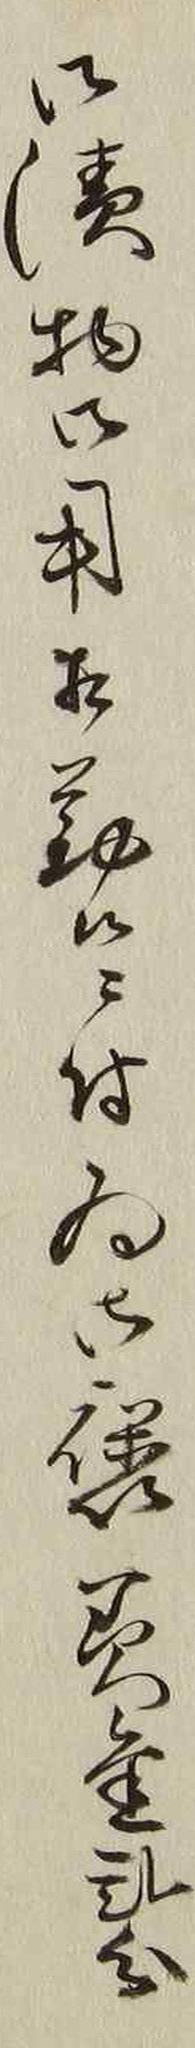御漬物御用相勤候ニ付為御褒美金弐分
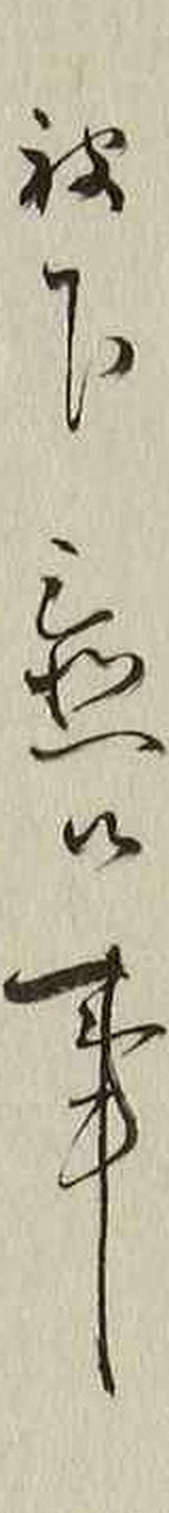被下置候事
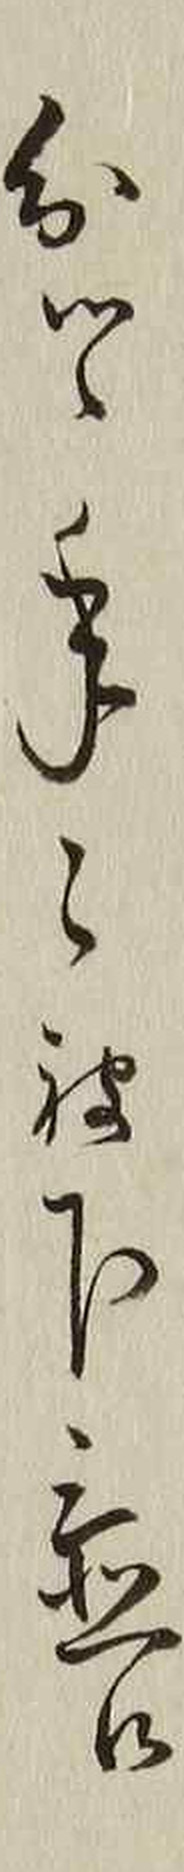分ッヽ年々被下置候
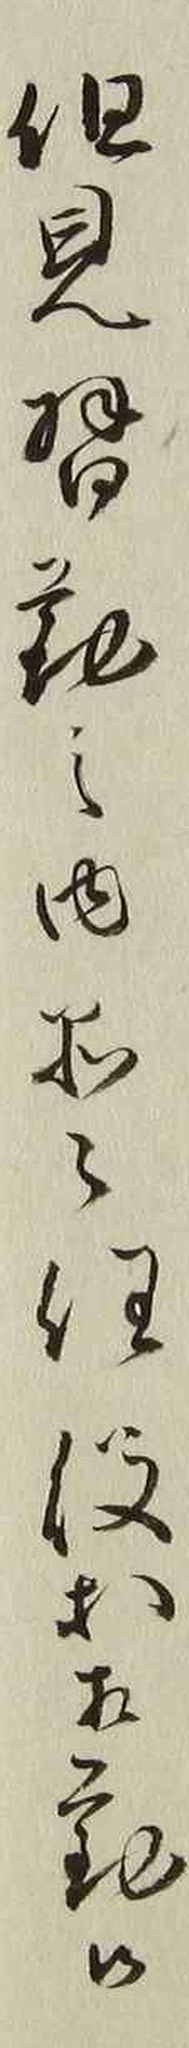但見習勤之内品々任役等相勤候
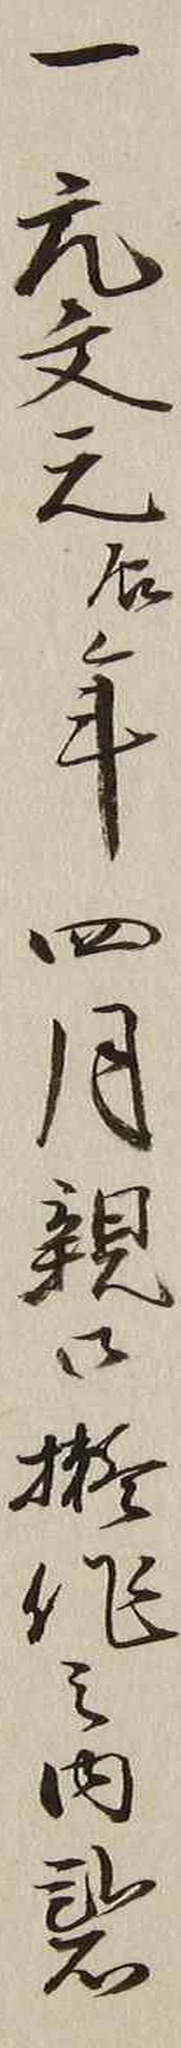一元文元辰年四月親御擬作之内弐石
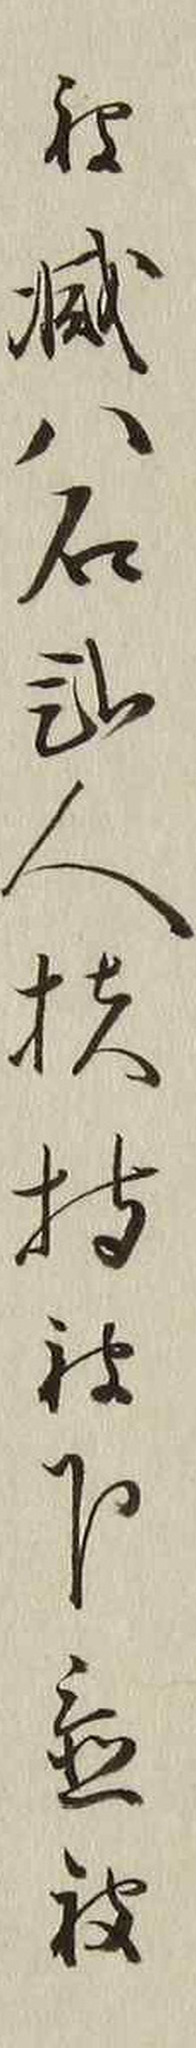被減八石弐人扶持被下置被
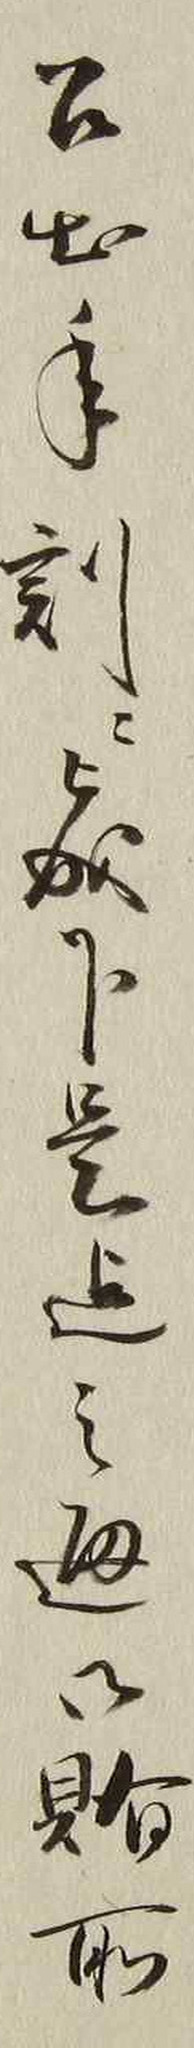召出年割ニ被成下是迄之通御賄所
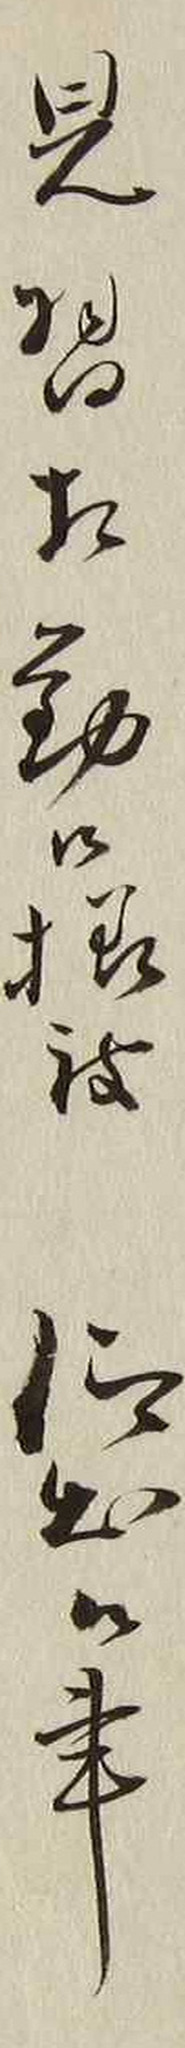見習相勤候様被仰出候事
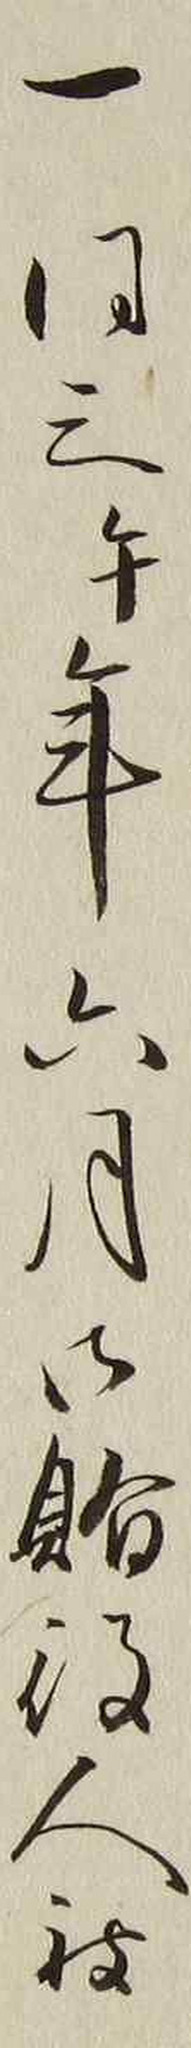一同三午年六月御賄役人被
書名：諸士系譜　巻之163　な之部5
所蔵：会津若松市立会津図書館
